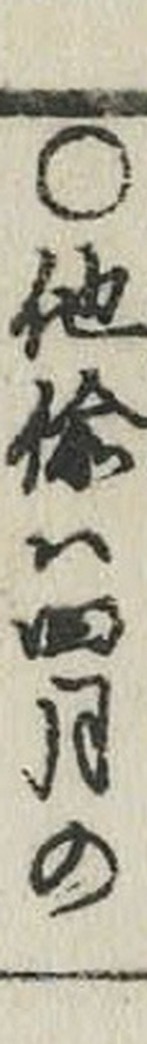○他偷は四月の
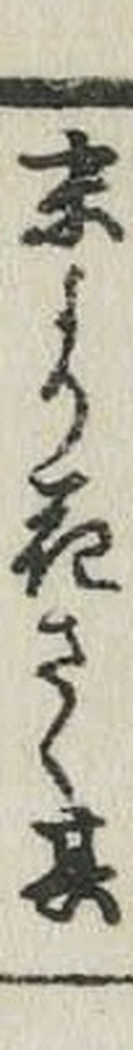末より花さく其
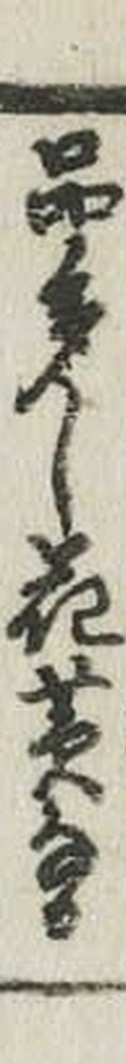品多し花黄なる
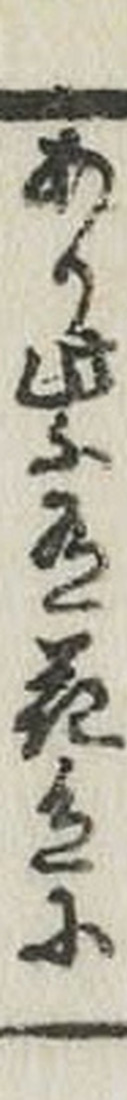あり紫有花色に
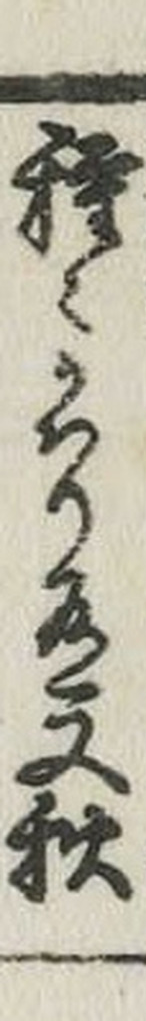種々かはり有又秋
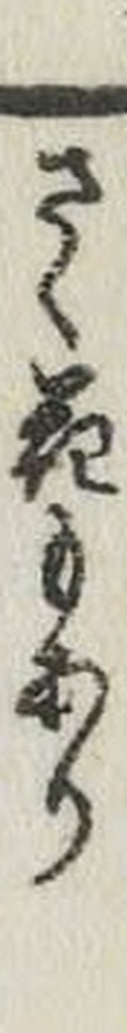さく花もあり
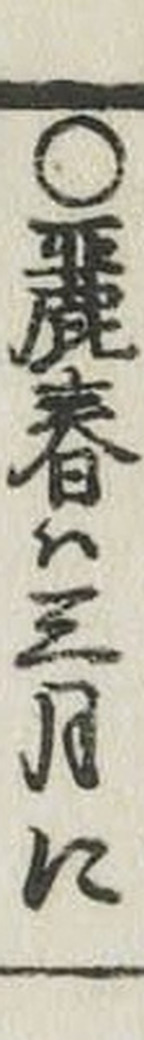○麗春は三月に
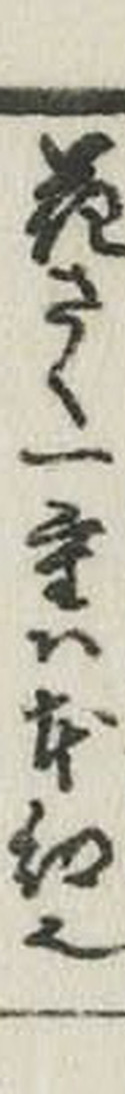花さく一重は本紅也
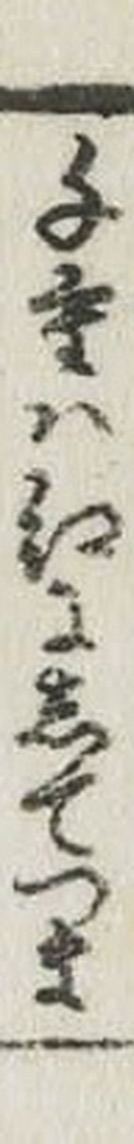千重は紅にしてつま
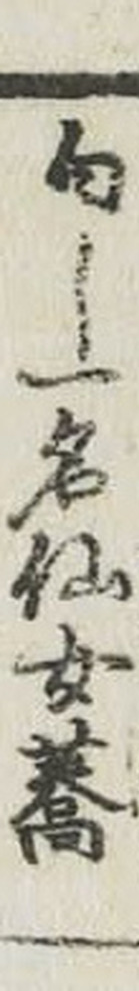白し一名仙女蕎
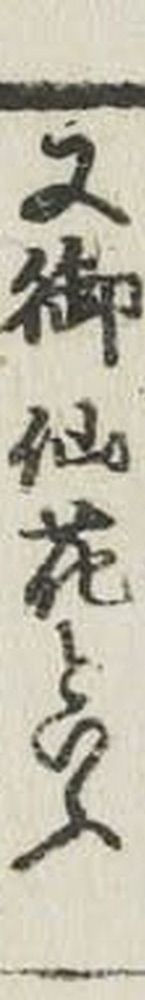又御仙花といふ
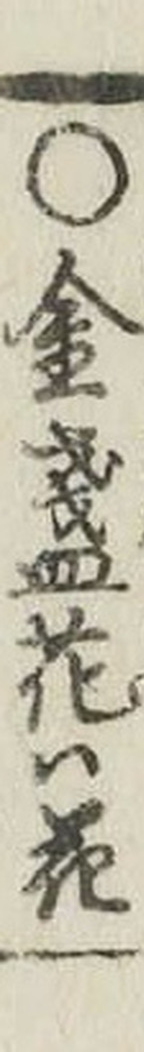○金盞花は花
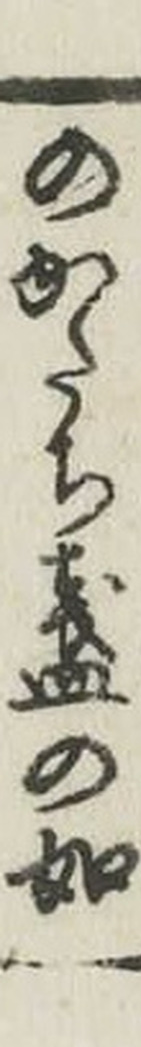のかたち盞の如
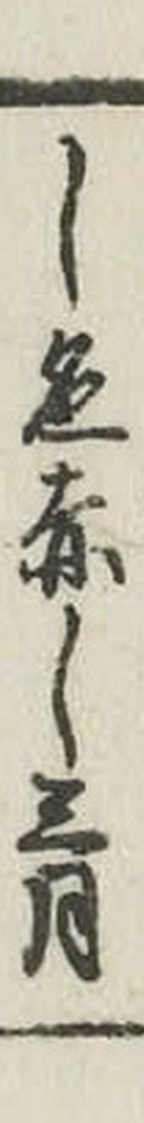し色赤し三月
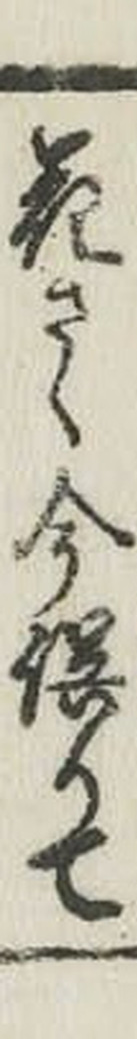花さく今誤りて
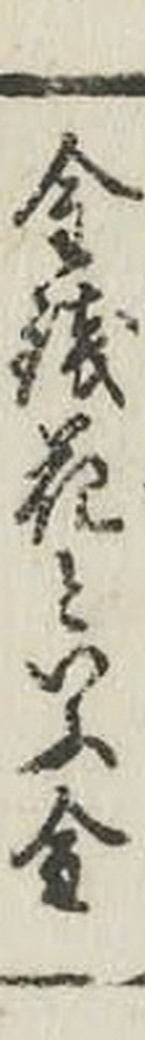金銭花といふ金
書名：増補頭書訓蒙図彙大成 10巻 9:巻之20
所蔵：東京学芸大学教育コンテンツアーカイブ
